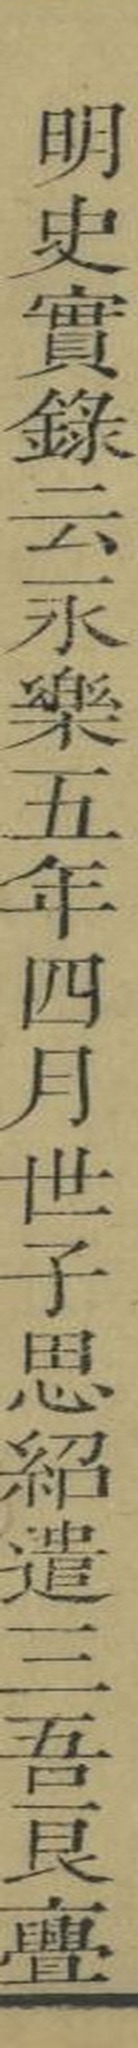明史実録云永楽五年四月世子思紹遣三吾良亹
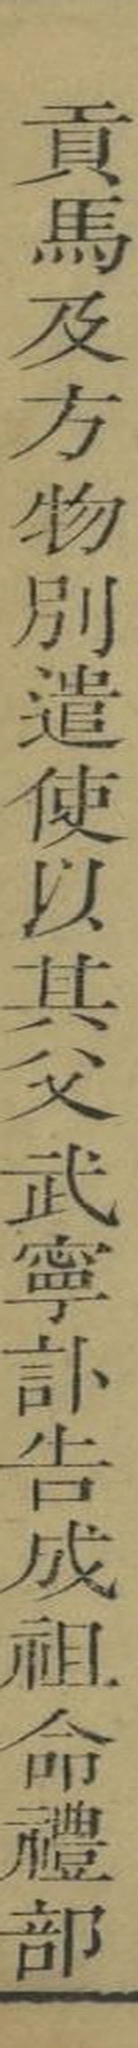貢馬及方物別遣使以其父武寧訃告成祖命礼部

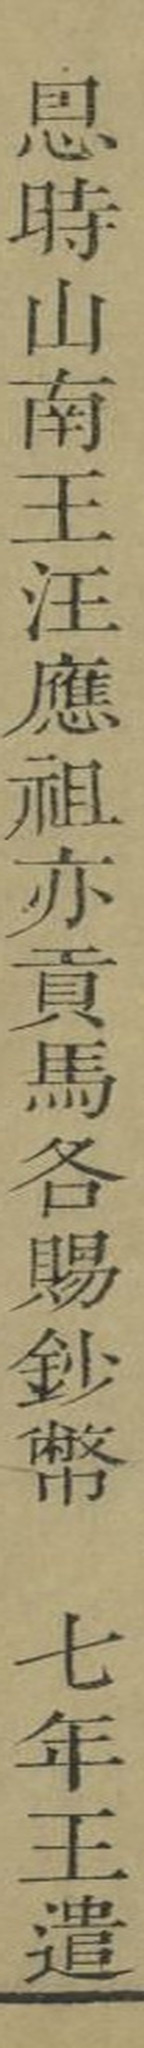恩時山南王汪応祖亦貢馬各賜鈔幣七年王遣
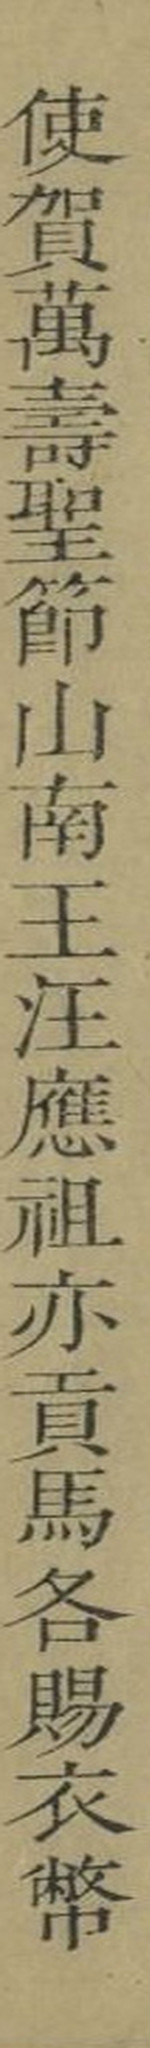使賀万寿聖節山南王汪応祖亦貢馬各賜衣幣
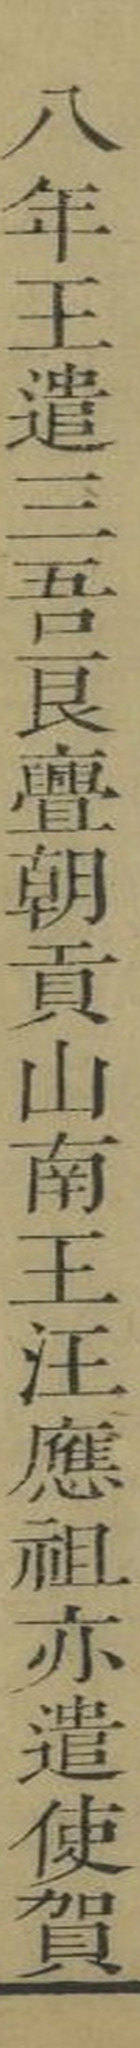八年王遣三吾良亹朝貢山南王汪応祖亦遣使賀
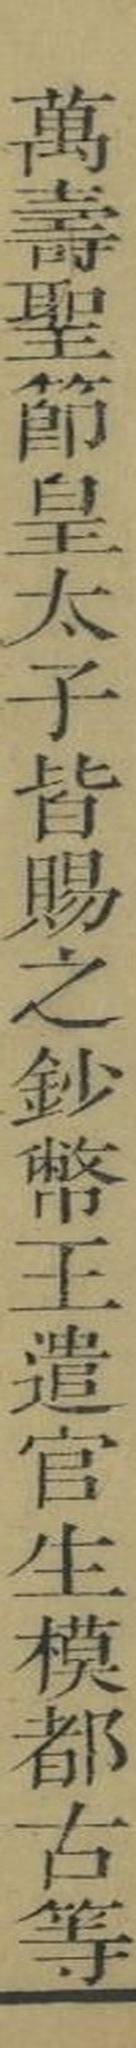万寿聖節皇太子皆賜之鈔幣王遣官生模都古等
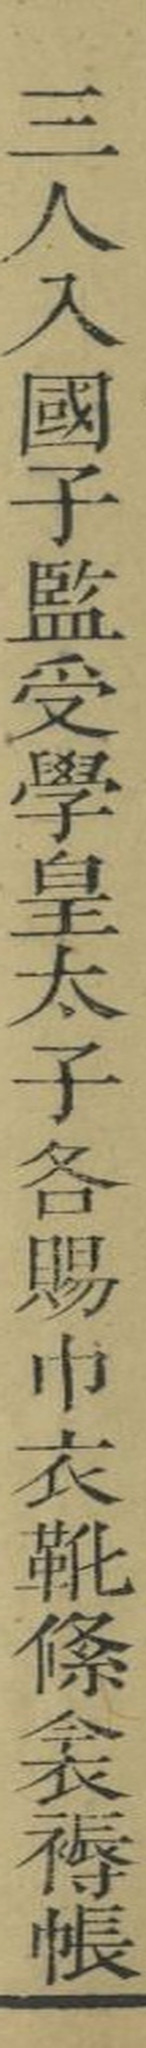三人入国子監受学皇太子各賜巾衣靴絛衾褥帳
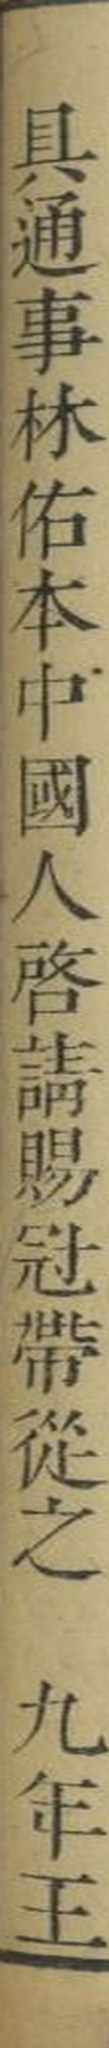具通事林佑本中国人啓請賜冠帯従之九年王
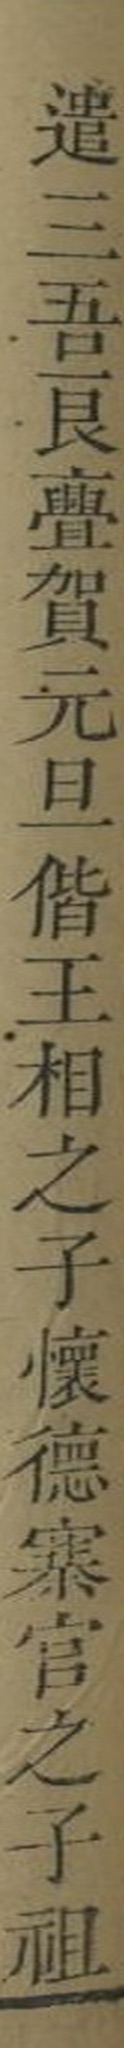遣三吾良亹賀元旦偕王相之子懐徳寨官之子祖
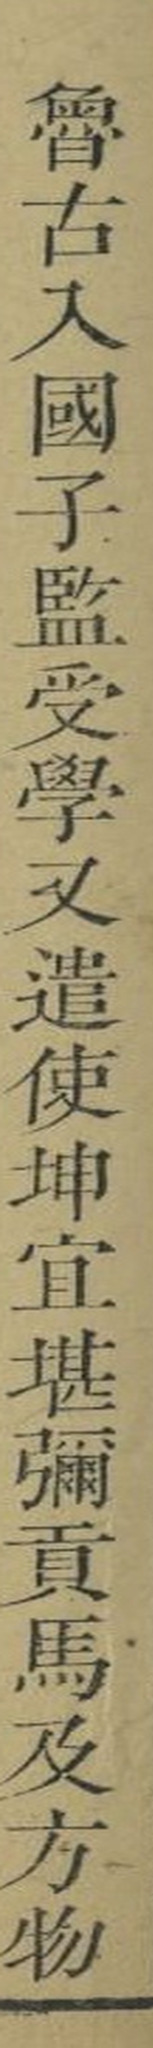魯古入国子監受学又遣使坤宜堪弥貢馬及方物
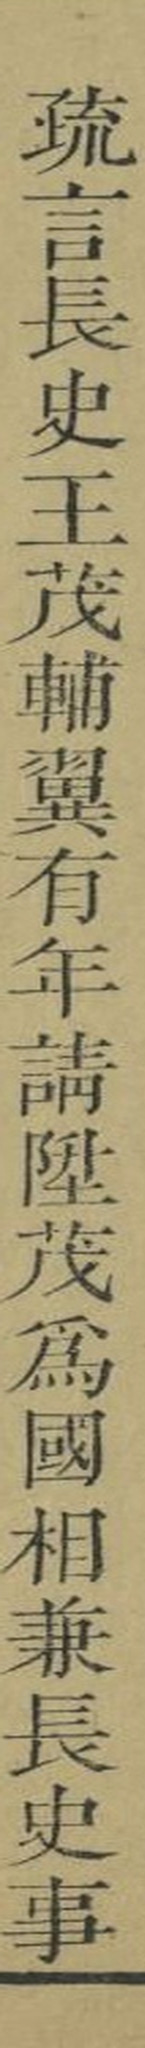疏言長史王茂輔翼有年請陞茂為国相兼長史事
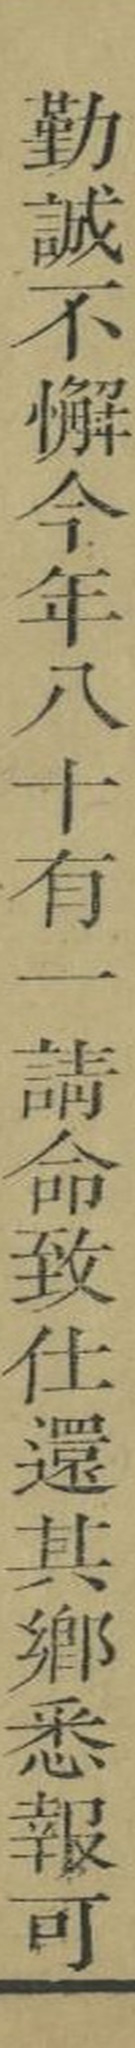勤誠不懈今年八十有一請命致仕還其郷悉報可
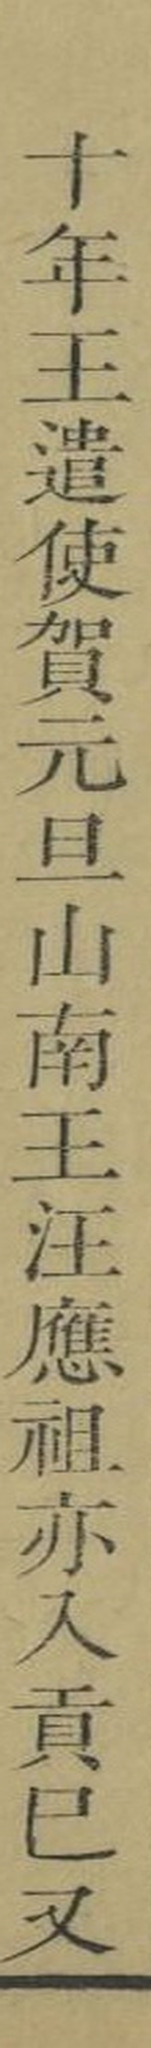十年王遣使賀元旦山南王汪応祖亦入貢巳又
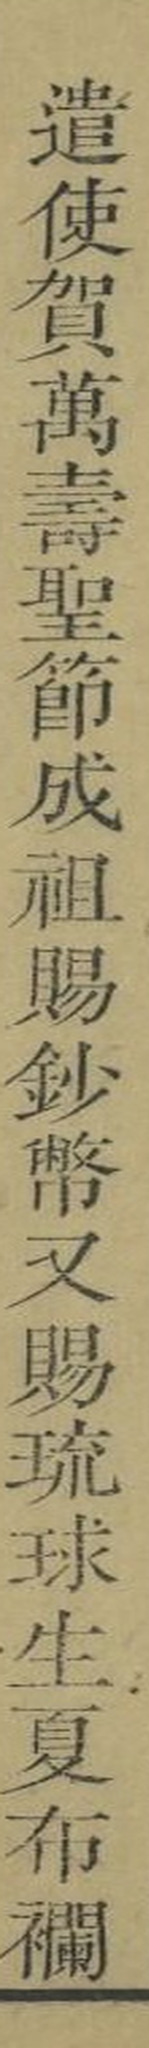遣使賀万寿聖節成祖賜鈔幣又賜琉球生夏布襴
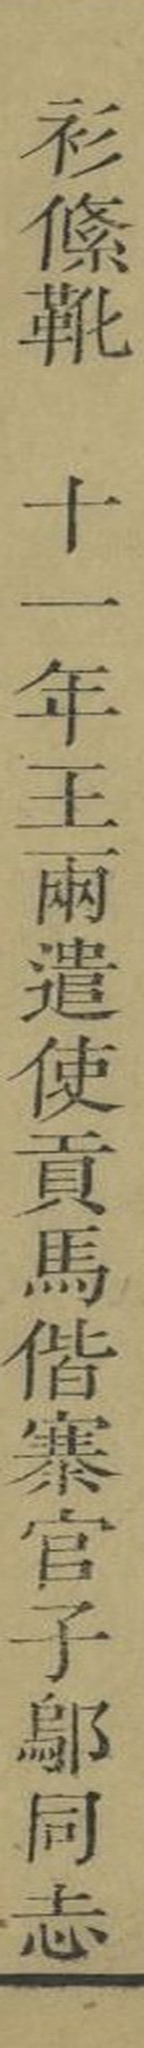衫絛靴十一年王両遣使貢馬偕寨官子鄔同志

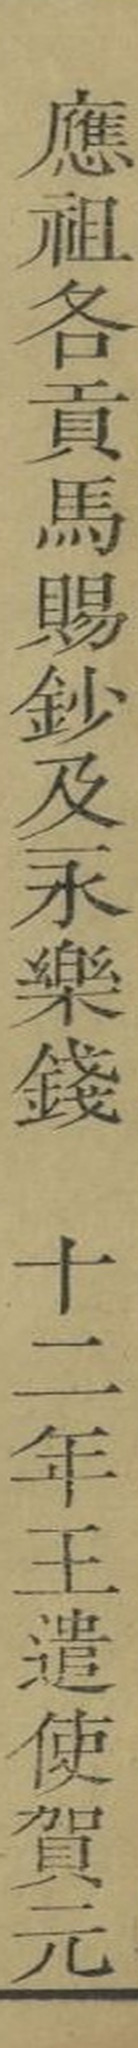応祖各貢馬賜鈔及永楽銭十二年王遣使賀元
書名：中山伝信録 巻三
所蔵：University of the Ryukyus Library
